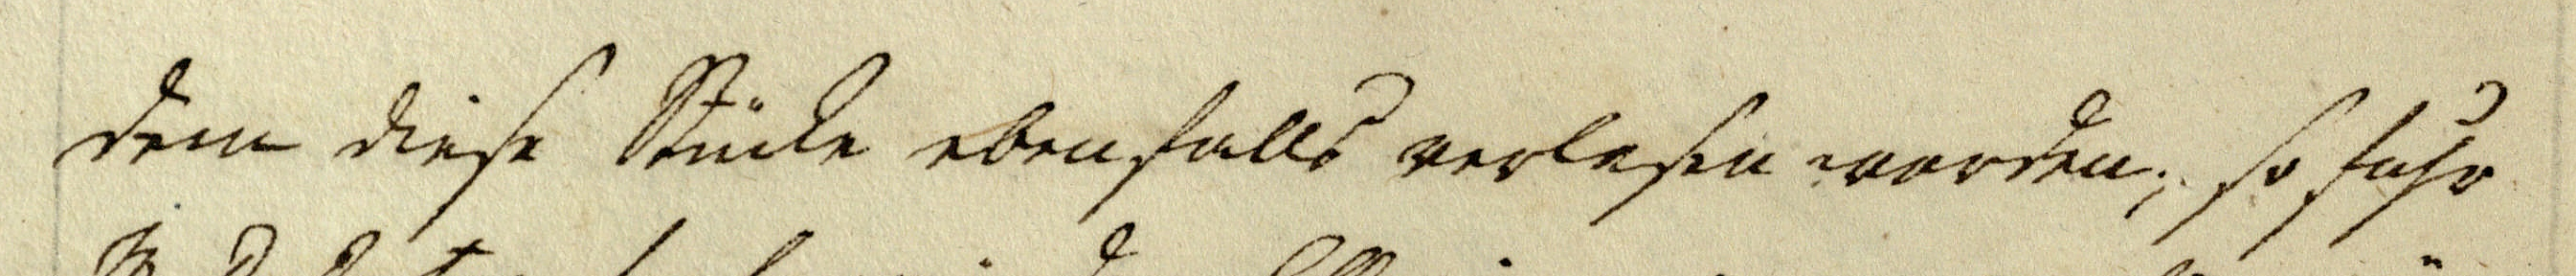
dem diese Stücke ebenfalls verlesen worden, so fuhr
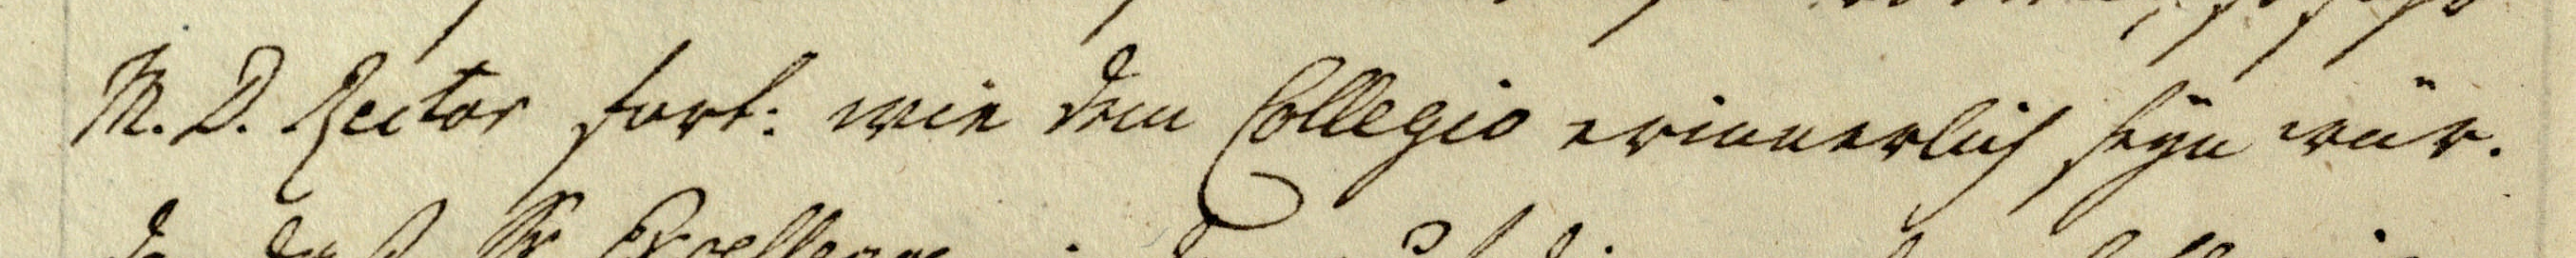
M. D. Rector fort: wie dem Collegio erinnerlich seÿn wür¬
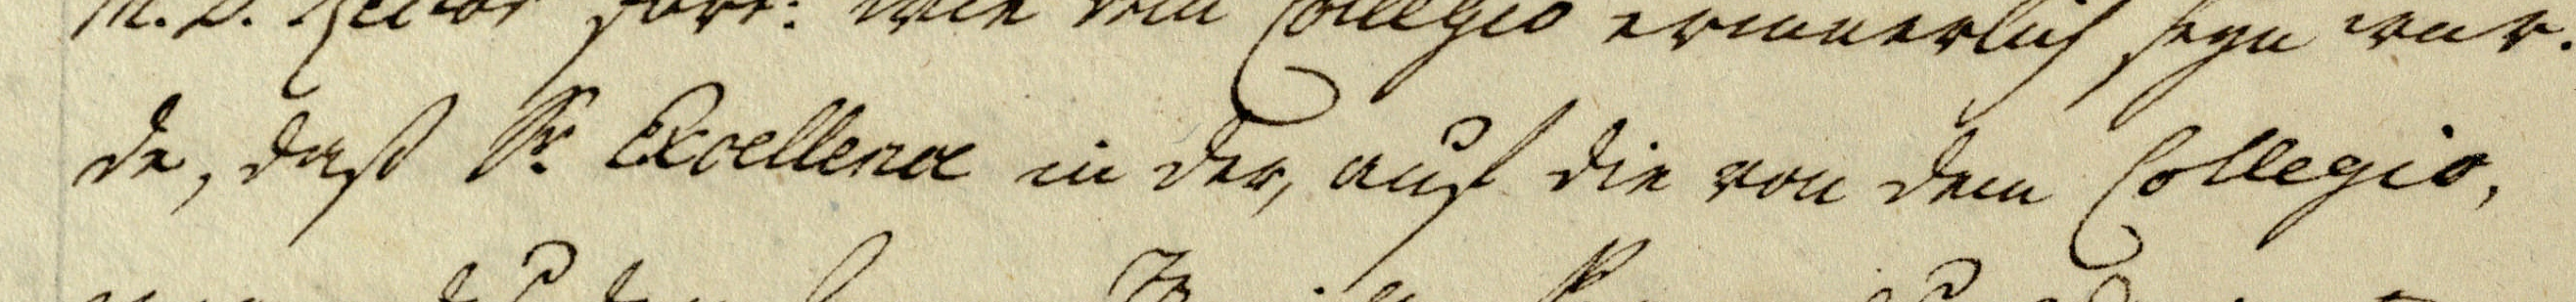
de, daß Sr Excellence in der, auf die von dem Collegio,
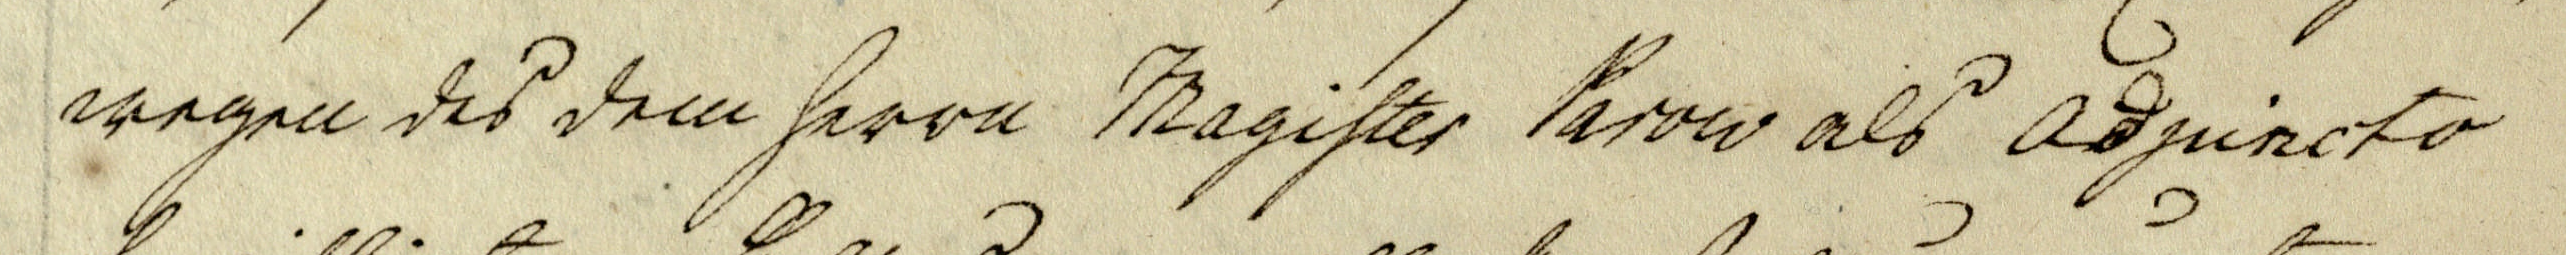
wegen des dem Herrn Magister Parow als Adjuncto
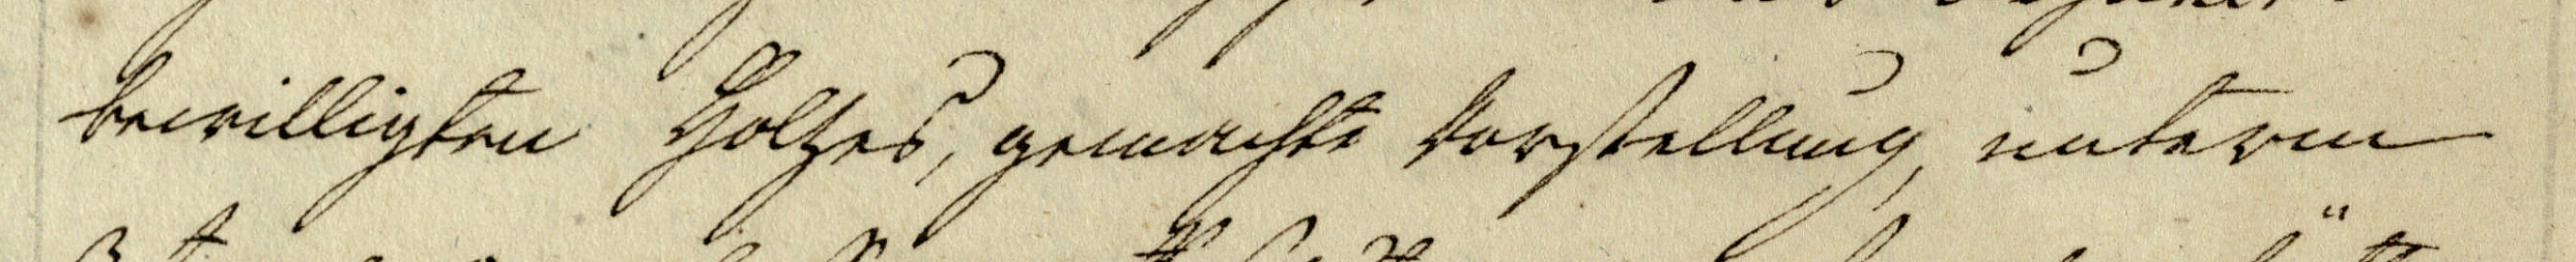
bewilligten Holzes, gemachte Vorstellung, unterm
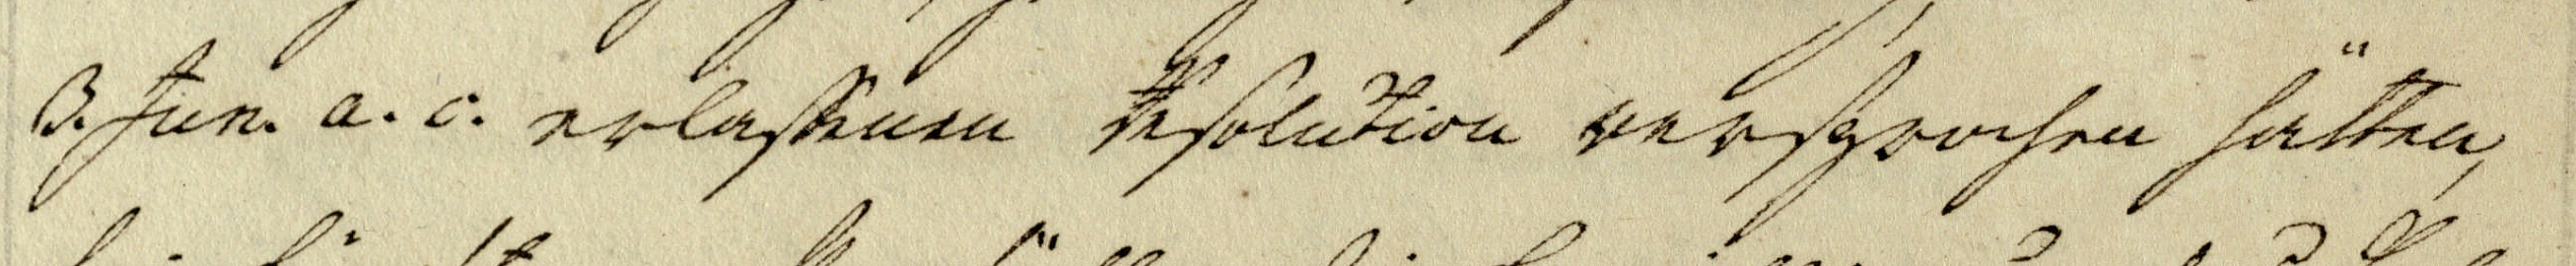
3. Jun. a. c. erlassenen Resolution versprochen hätten,
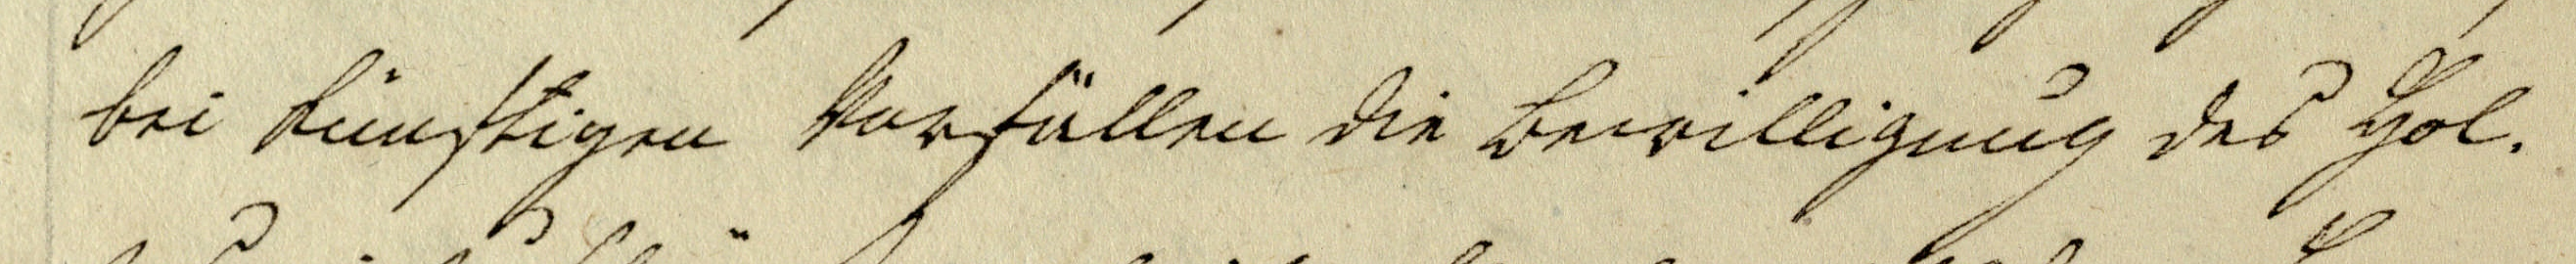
bei künftigen Vorfällen die Bewilligung des Hol¬
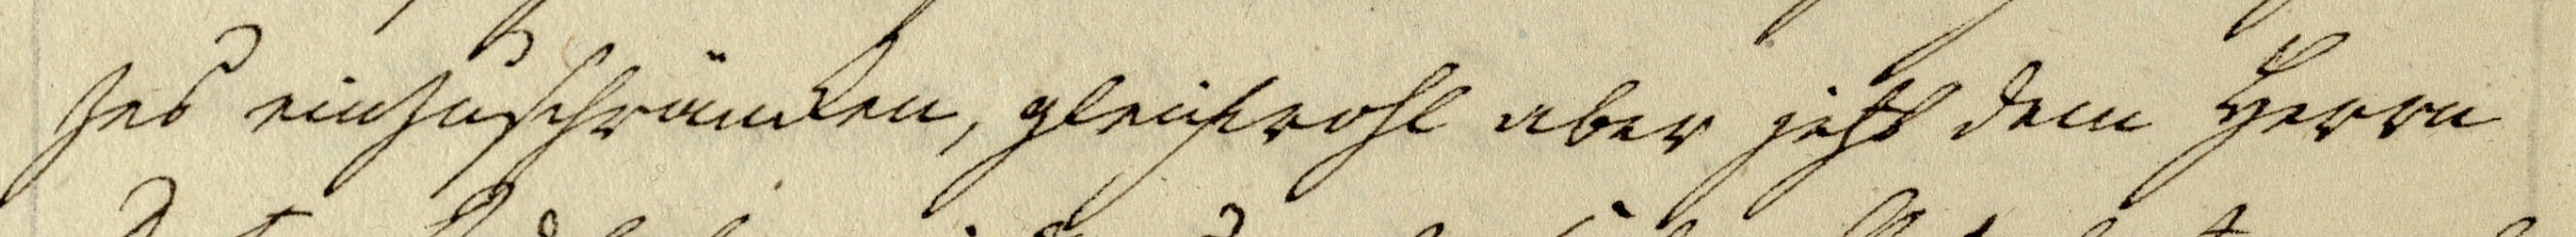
zes einzuschränken, gleichwohl aber jetzt dem Herrn
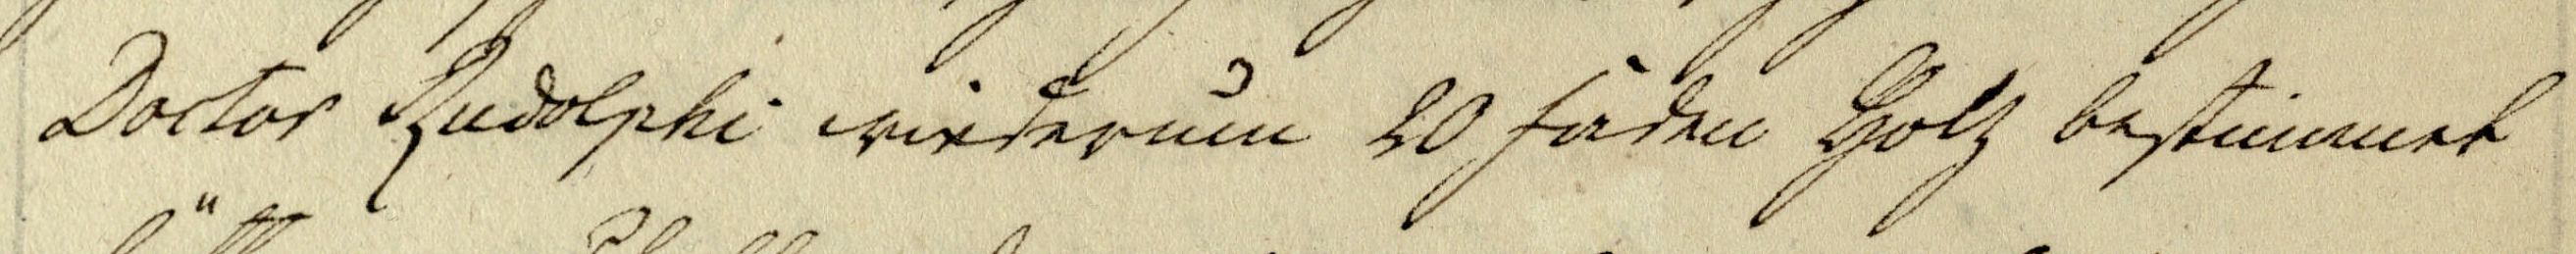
Doctor Rudolphi wiederum 20 Faden Holz bestimmet
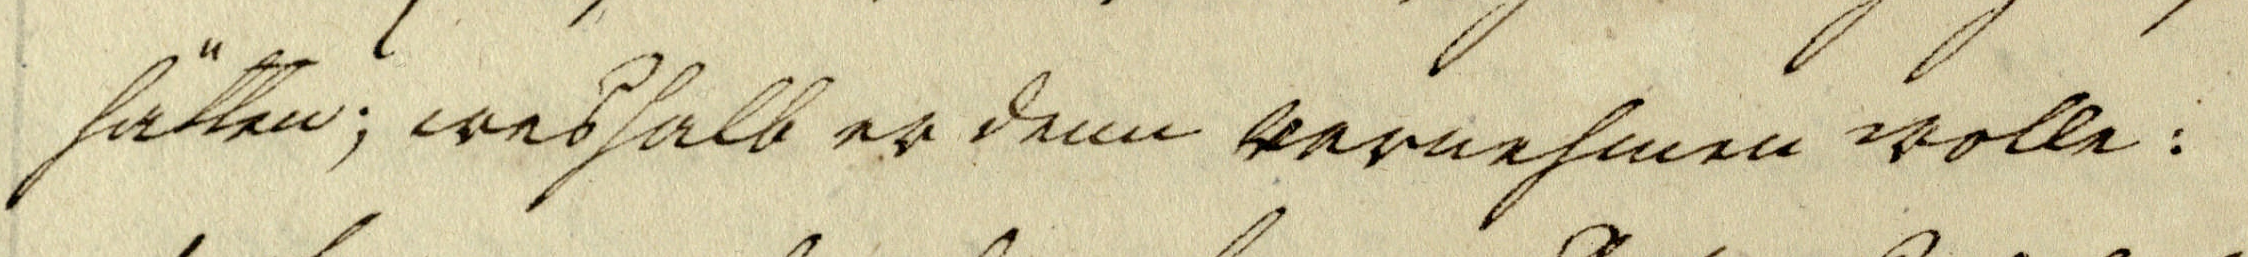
hätten; weshalb er denn vernehmen wolle:
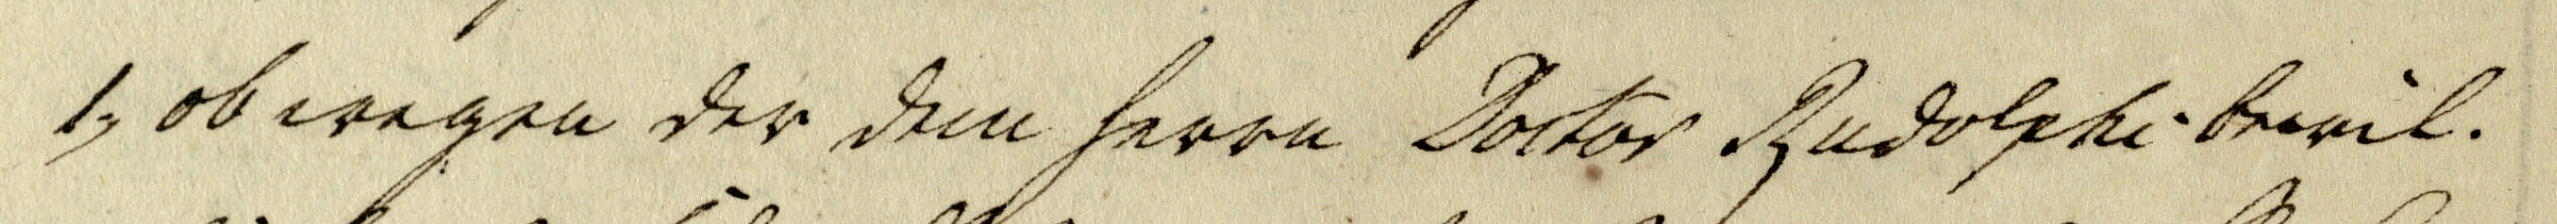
1, ob wegen der dem Herrn Doctor Rudolphi bewil¬
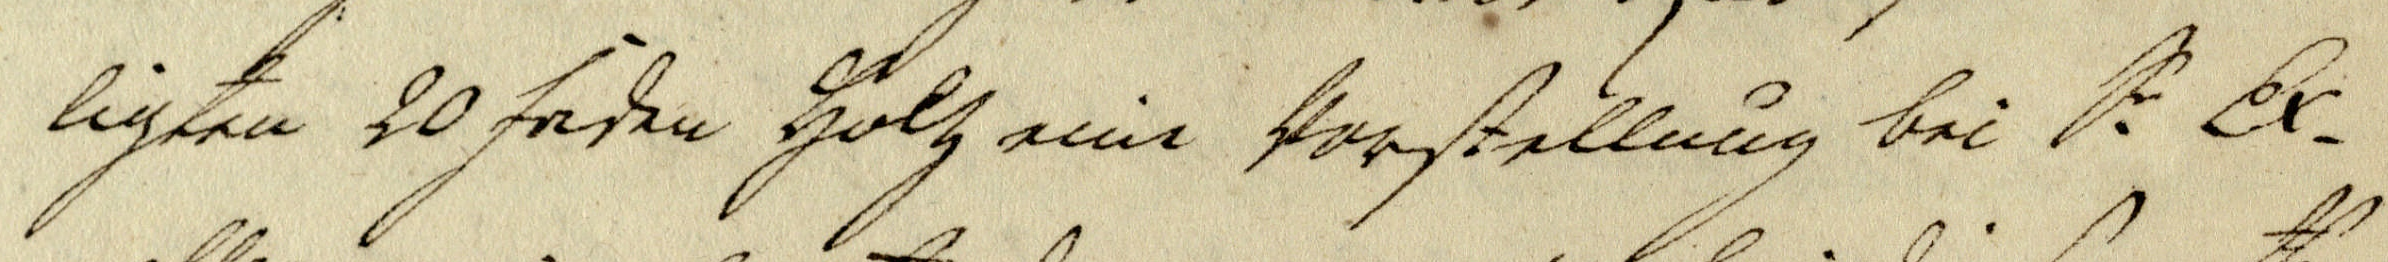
ligten 20 Faden Holz eine Vorstellung bei Sr Ex¬
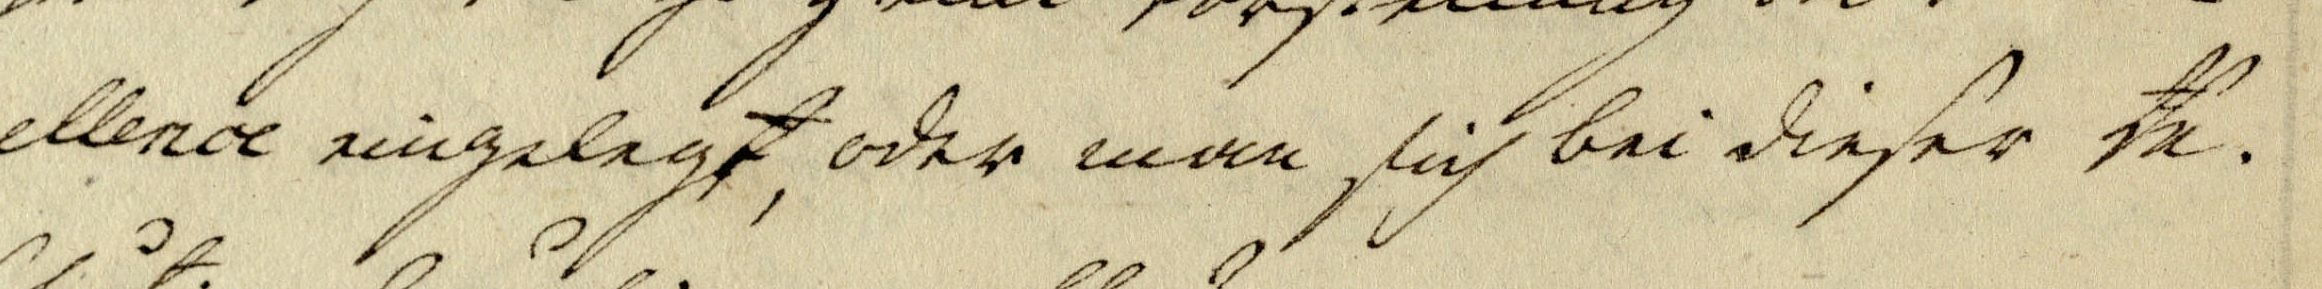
cellence eingelegt, oder man sich bei dieser Re¬
